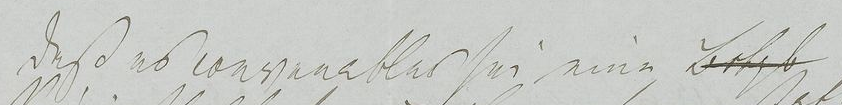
daß es convenabler sei eine Bötzb
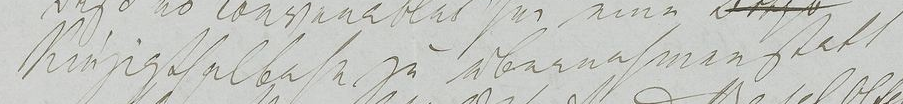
Kinzigthalbahn zu übernehmen statt
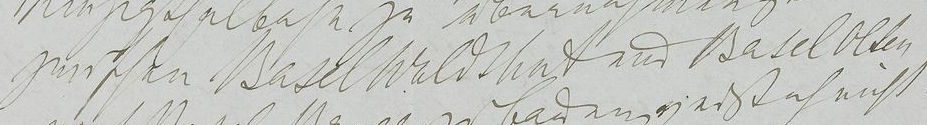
zwischen BaselWaldshut und BaselOlten
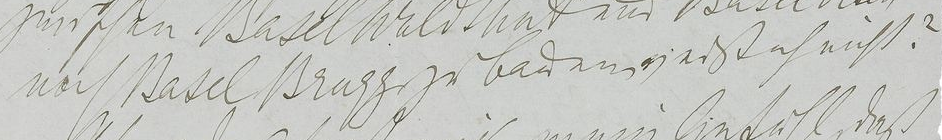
noch BaselBrugg zu bauen, weiß ich nicht?
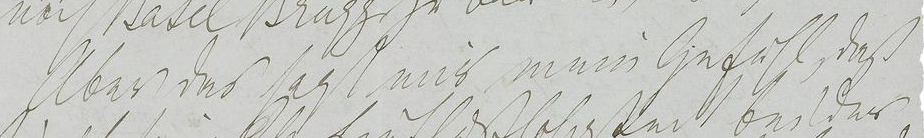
Aber das sagt mir mein Gefühl, daß
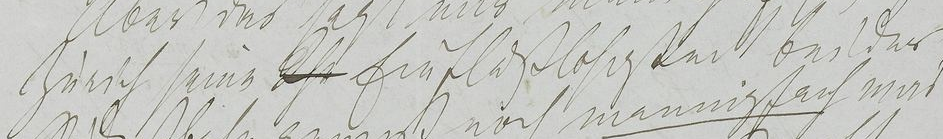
Zürich seine ... Einflußlosigkeit bei der
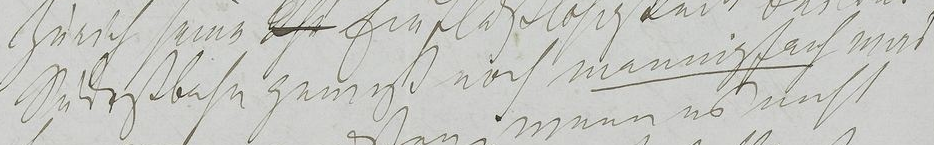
Südostbahn gewiß noch mannigfach wird
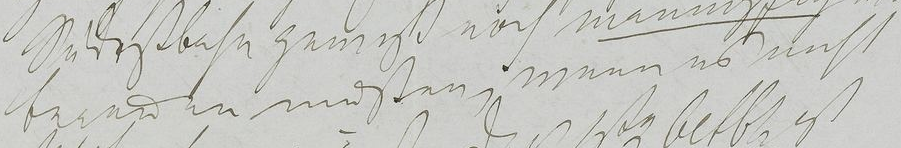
bereuen müßen, wenn es nicht
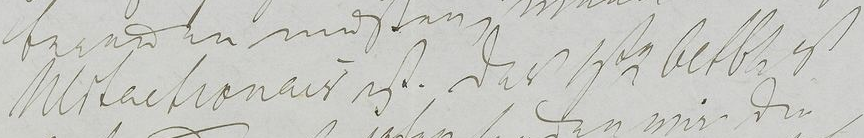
Mitactionair ist. Der 1ste Octbr ist
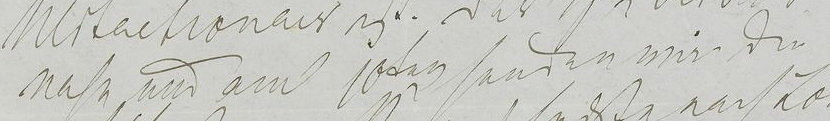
nahe und am 10ten senden wir die
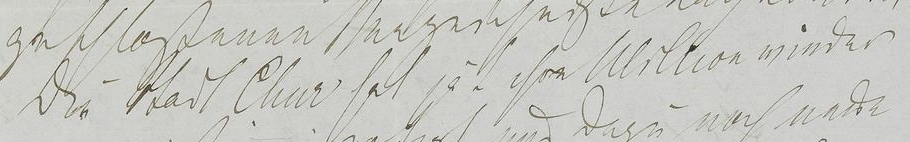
Die Stadt Chur hat ja ihre Million wieder
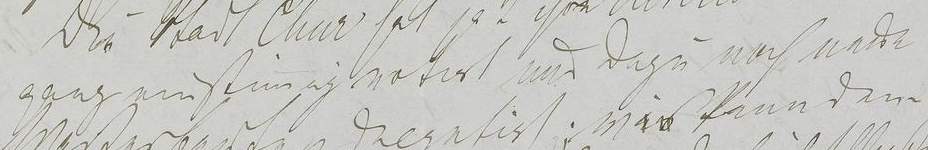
ganz einstimmig votirt und dazu noch neue
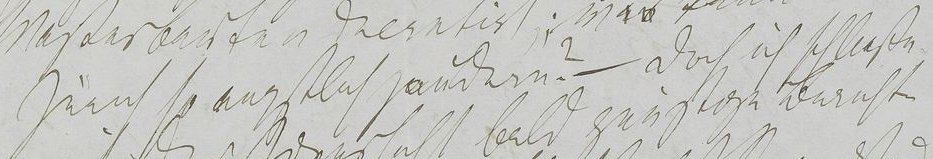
Zürich so ängstlich zaudern? – Doch ich schließe
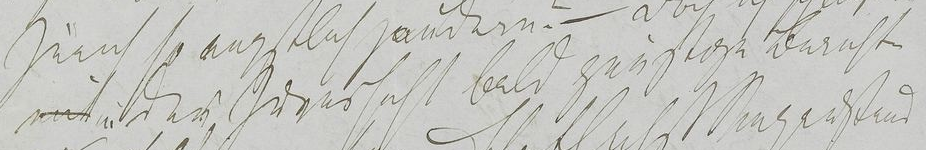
mit in der Zuversicht bald günstige Berichte
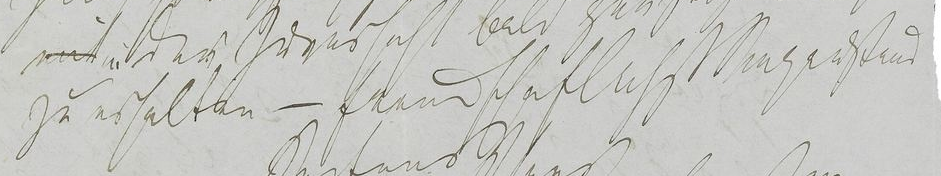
zu erhalten – freundschaftlichst Sie grüßend
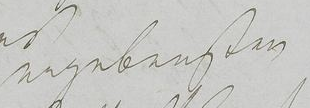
ergebensten
